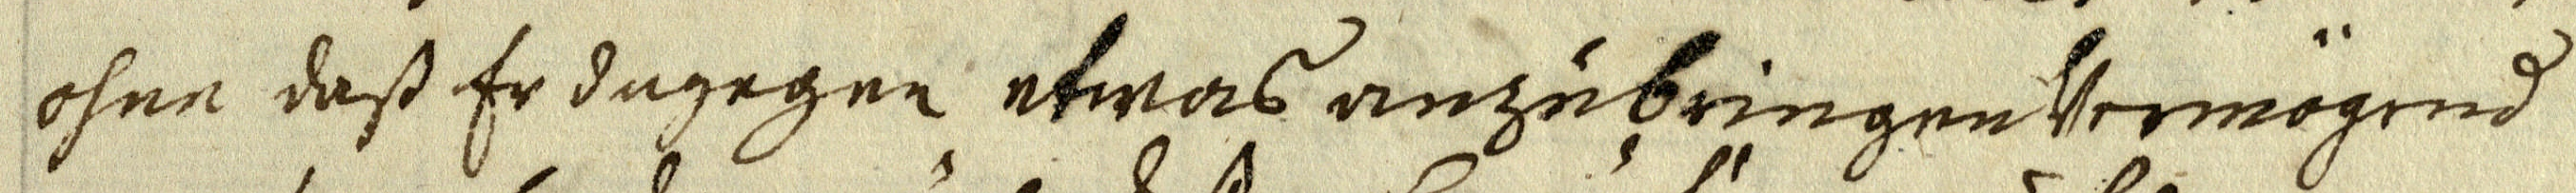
ohne daß Er dagegen etwas anzubringen vermögend
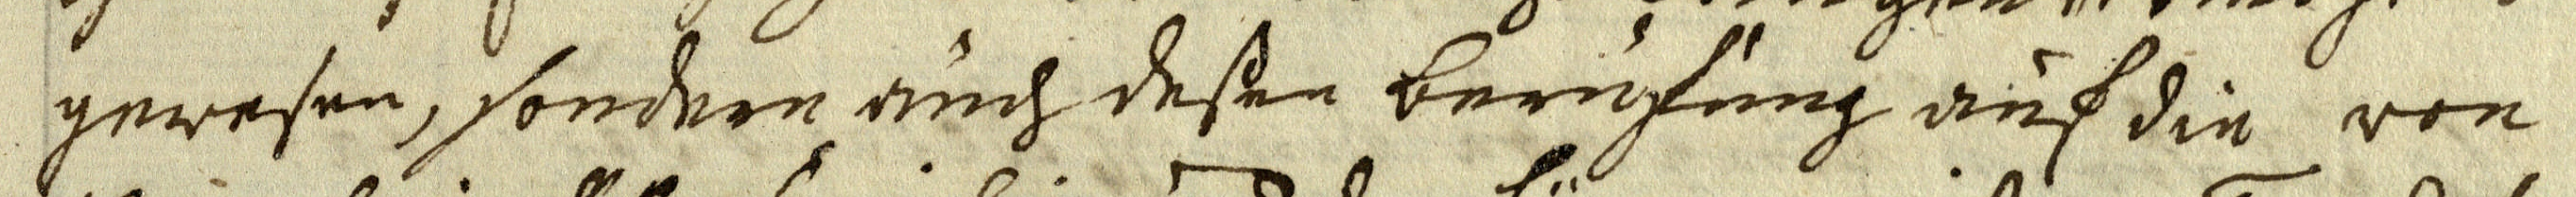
gewesen, sondern auch deßen Berufung auf die von
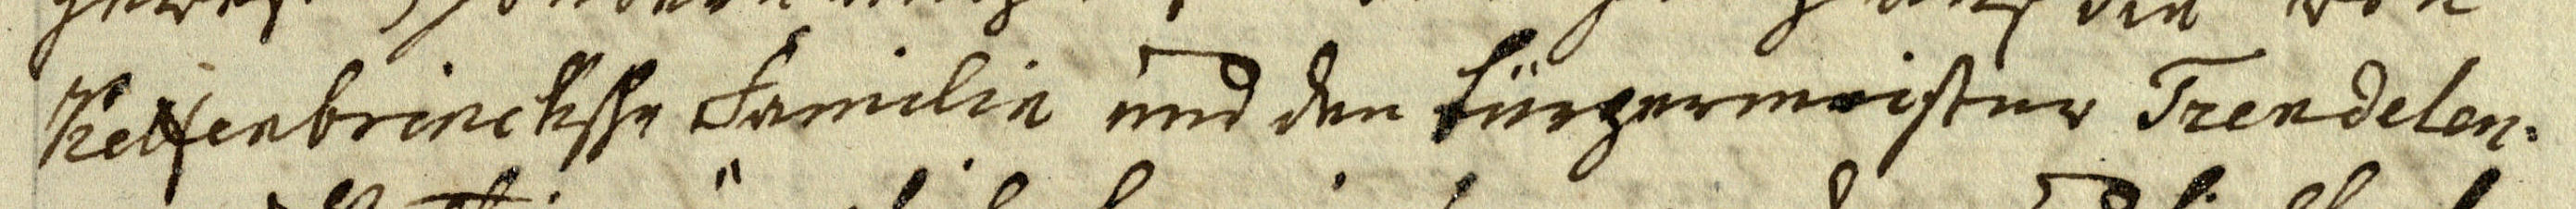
Keffenbrincksche Familie und den Bürgermeister Trendelen¬
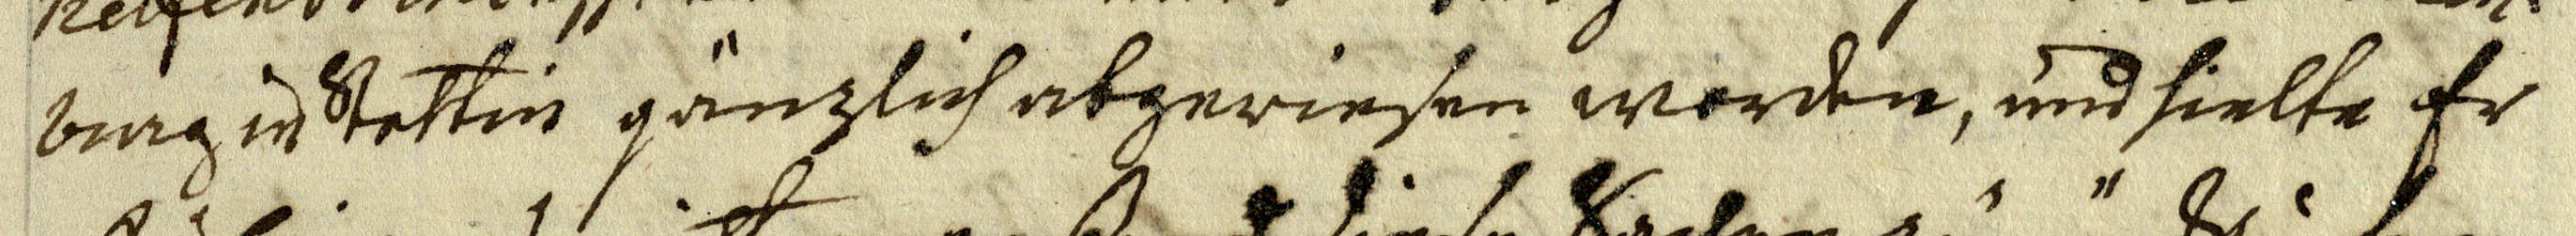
burg in Stettin gänzlich abgewiesen worden, und hielte Er
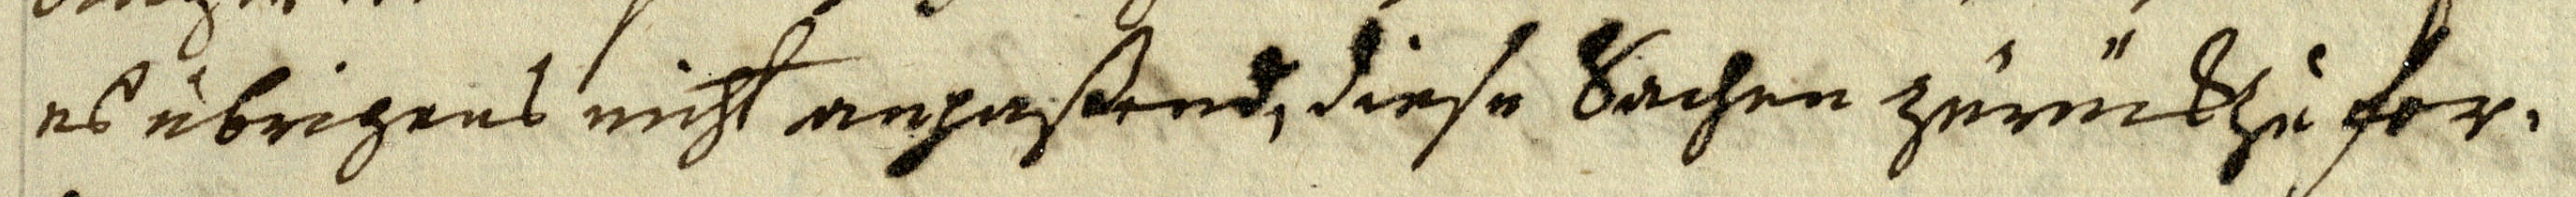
es übrigens nicht anpaßend, diese Sachen zurückzu for¬
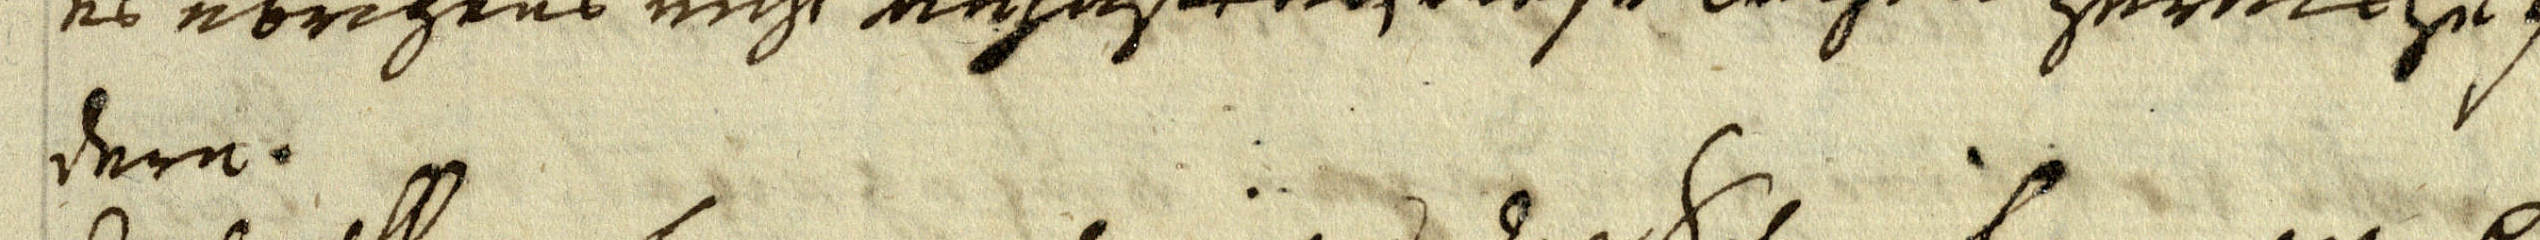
dern.
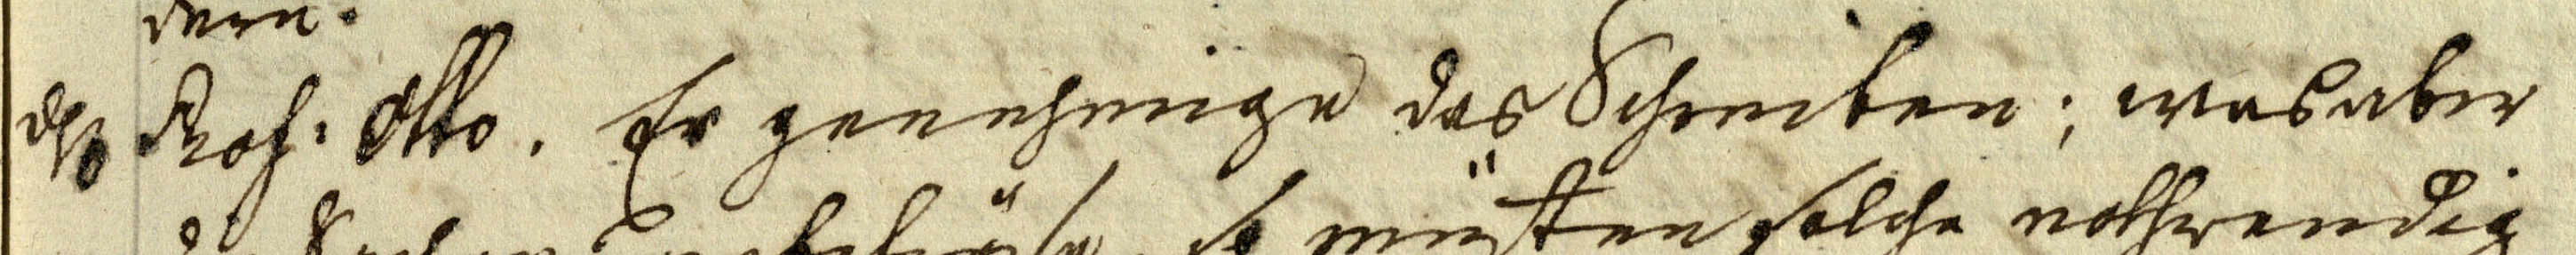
dh Prof. Otto. Er genehmige das Schreiben,; was aber
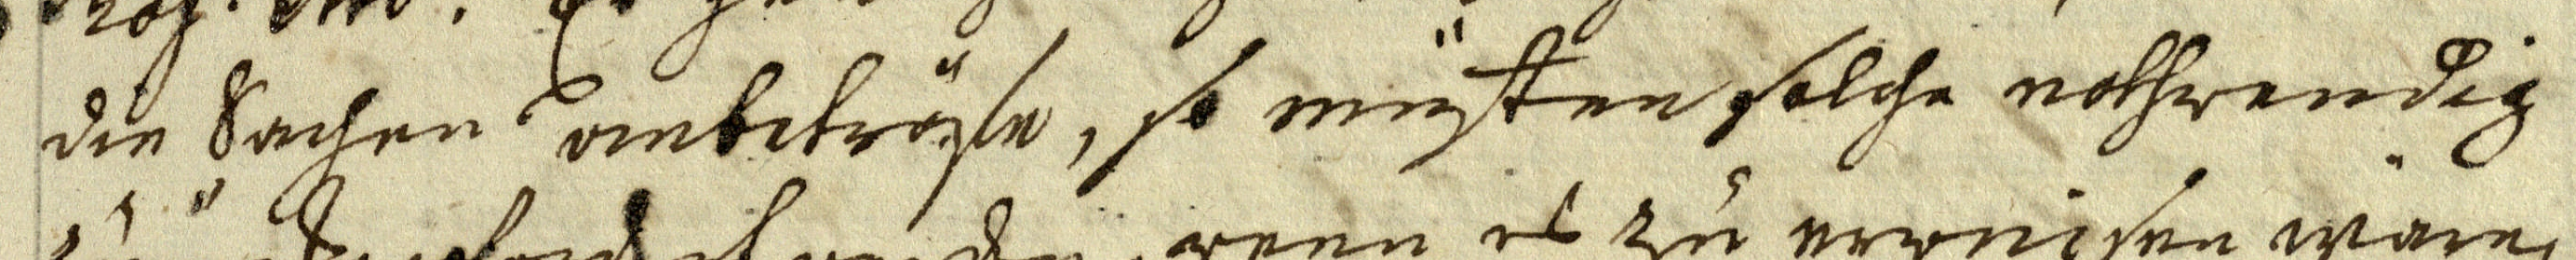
die Sachen anbeträfe, so müsten solch nothwendig
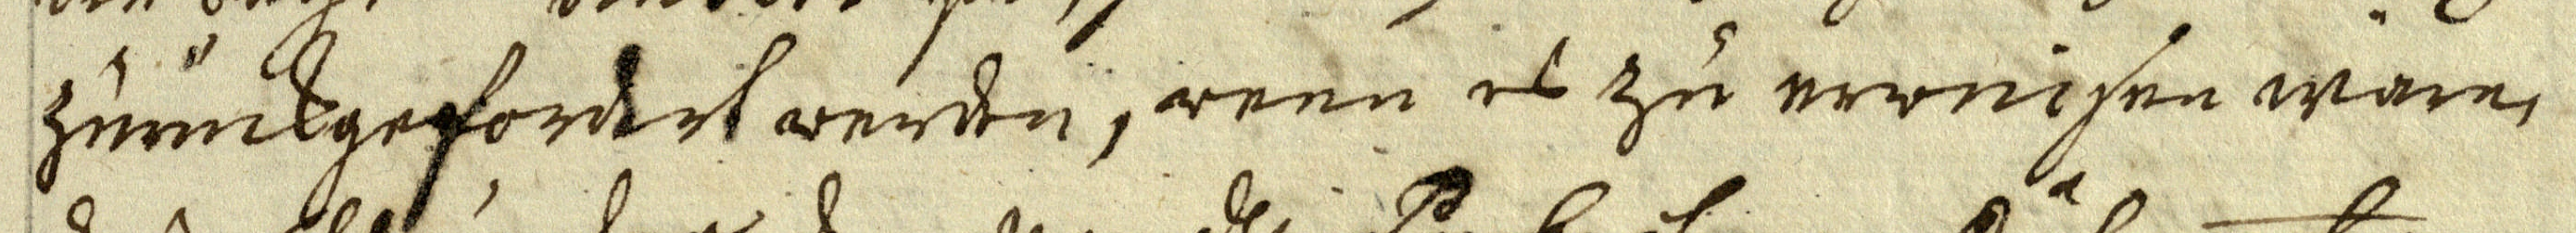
zurückgefordert werden, wenn es zu erweisen wäre,
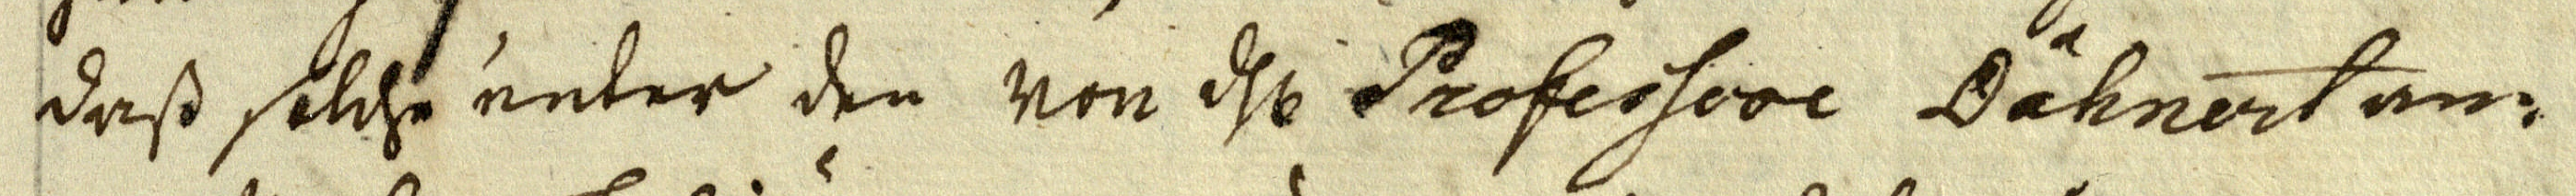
daß solche unter den von dh Professor Dähnert an¬
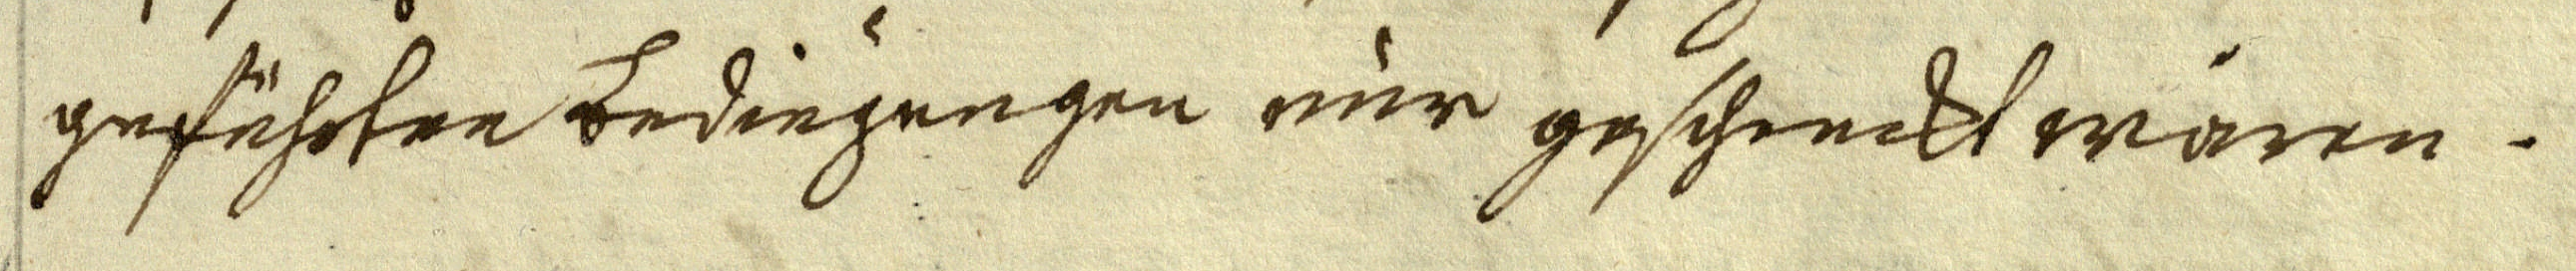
geführten Bedingungen nur geschenckt wären.
